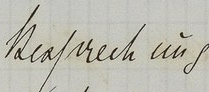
Besprechung
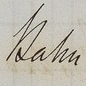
beiden
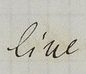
halten,
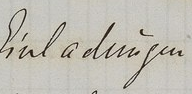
Einladungen
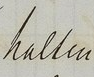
Montag)
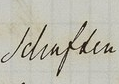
bereits
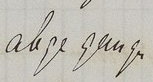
telegraphisch
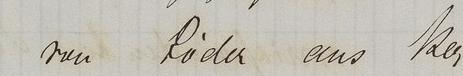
von Röder aus Ber-
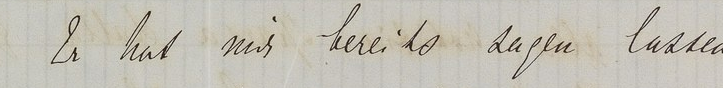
Er hat mir bereits sagen lassen,
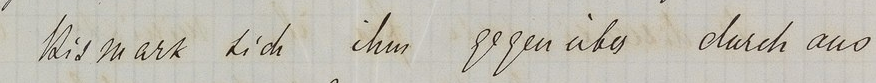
Bismark sich ihm gegenüber durchaus
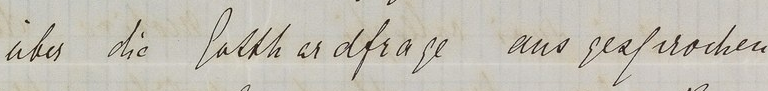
über die Gotthardfrage ausgesprochen
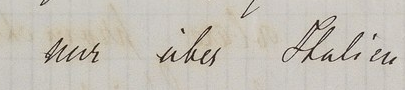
nur über Italien
